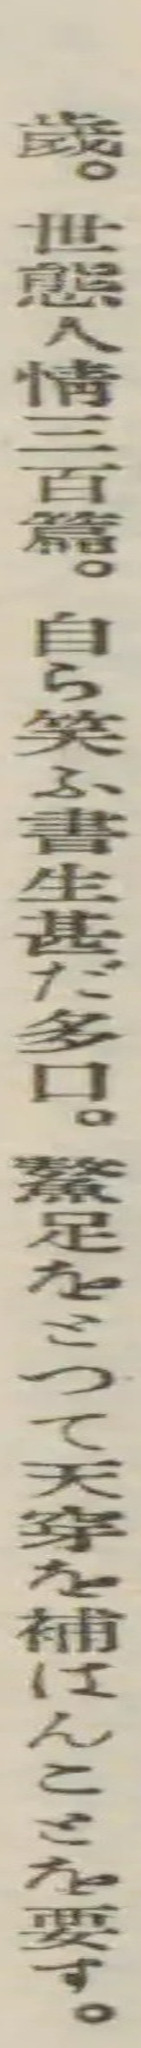歳。世態人情三百篇。自ら笑ふ書生甚だ多口。鼇足をとつて天穿を補はんことを要す。
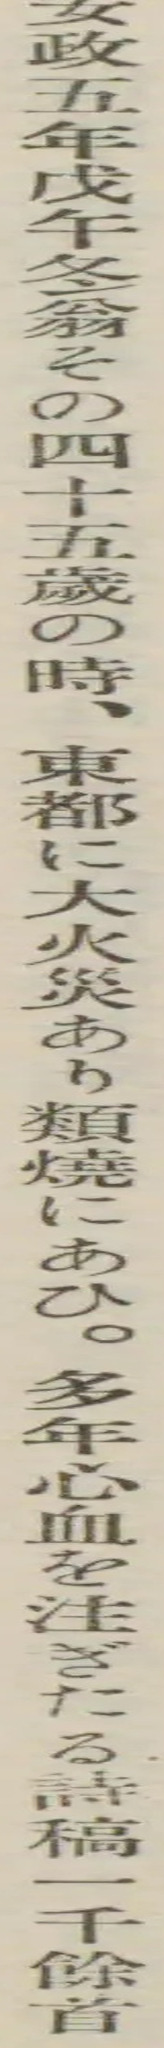安政五年戊午冬翁その四十五歳の時、東都に大火災あり類焼にあひ。多年心血を注ぎたる詩稿一千余首
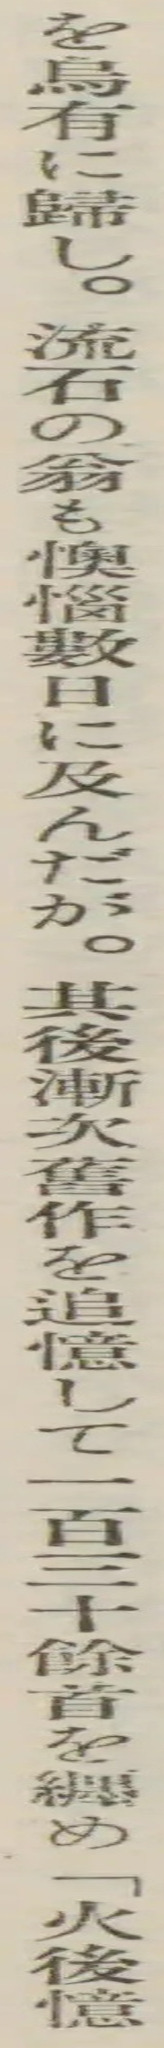を烏有に帰し。流石の翁も懊悩数日に及んだが。其後漸次旧作を追憶して一百三十余首を纏め「火後憶
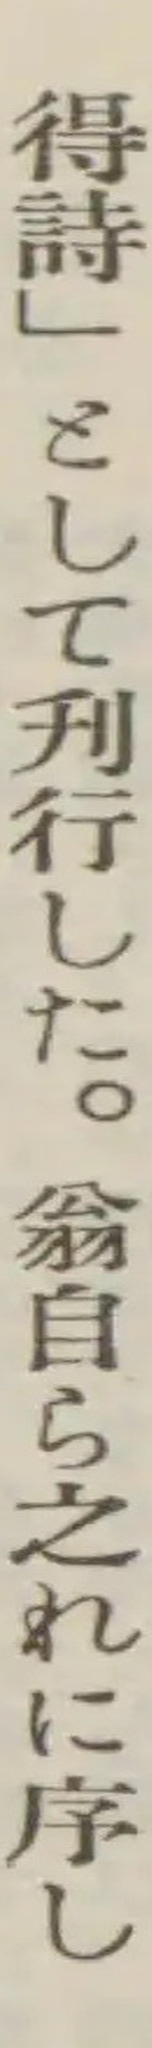得詩」として刊行した。翁自ら之れに序し
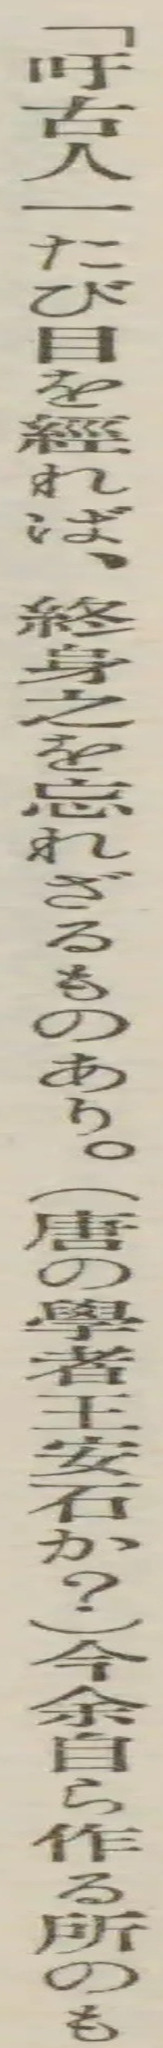「吁古人一たび目を経れば、終身之を忘れざるものあり。(唐の学者王安石か？)今余自ら作る所のも
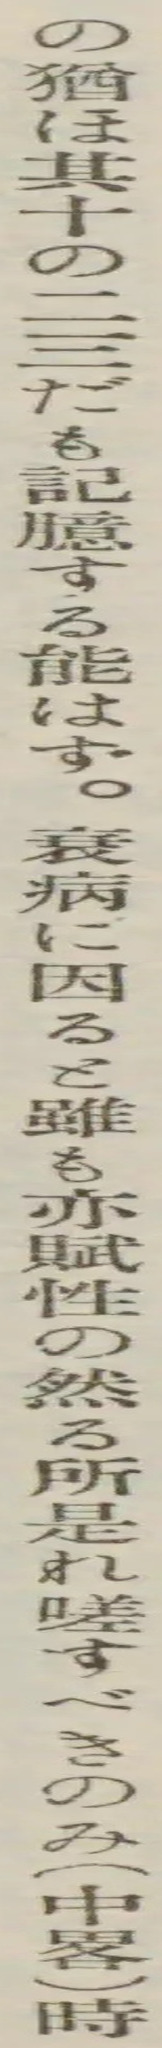の猶ほ其十の二三だも記憶する能はず。衰病に因ると雖も亦賦性の然る所是れ嗟すべきのみ(中略)時
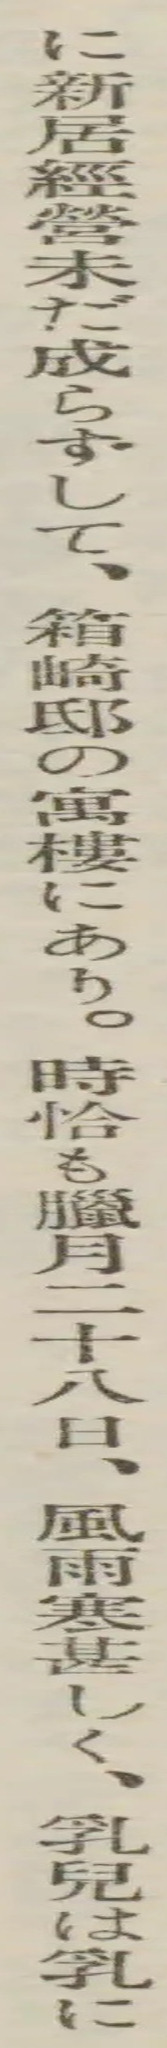に新居経営未だ成らずして、箱崎邸の寓楼にあり。時恰も臘月二十八日、風雨寒甚しく、乳児は乳に
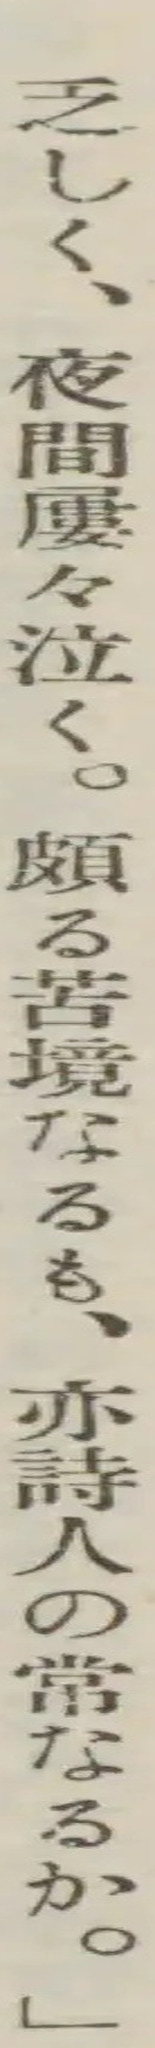乏しく、夜間屢々泣く。頗る苦境なるも、亦詩人の常なるか。」
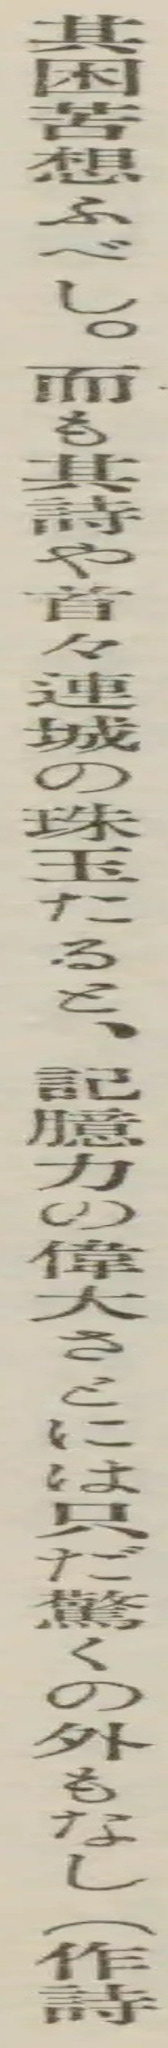其困苦想ふべし。而も其詩や首々連城の珠玉たると、記憶力の偉大さとには只だ驚くの外もなし(作詩
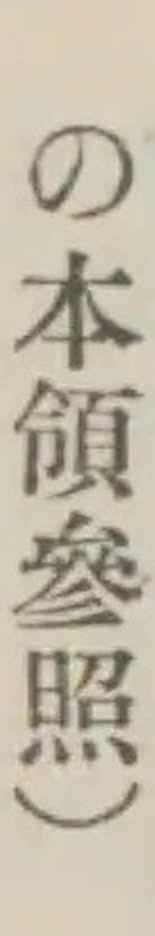の本領参照)
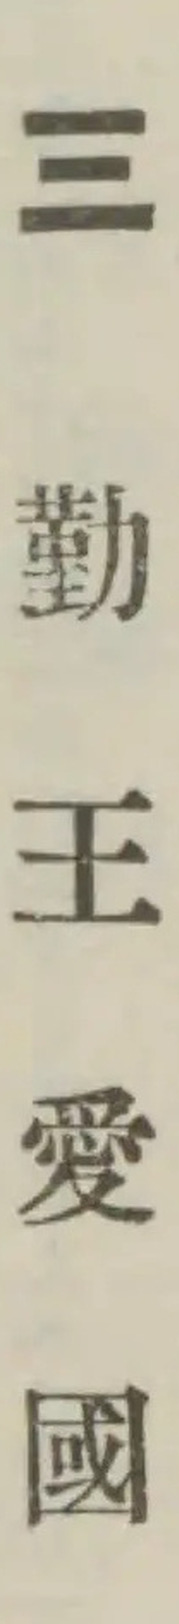三勤王愛国
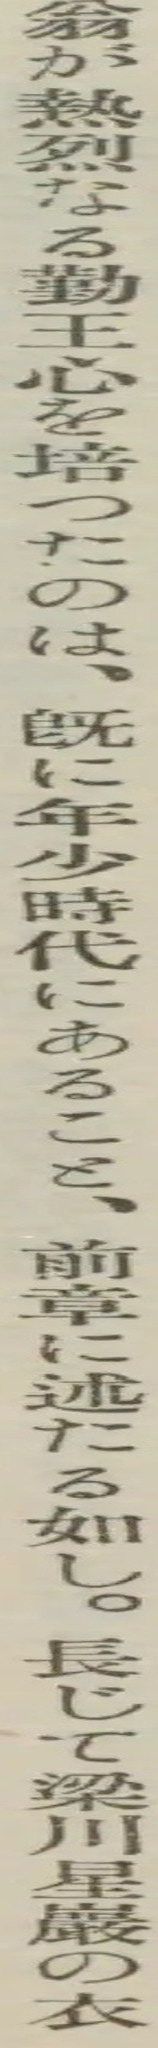翁が熱烈なる勤王心を培つたのは、既に年少時代にあること、前章に述たる如し。長じて梁河星巌の衣
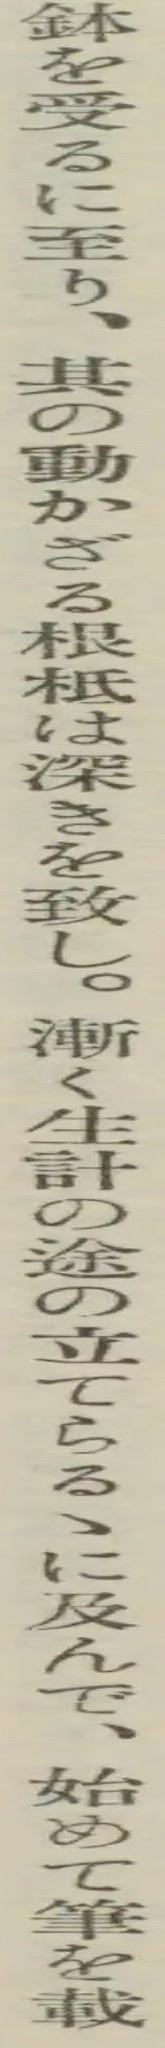鉢を受るに至り、其の動かざる根柢は深きを致し。漸く生計の途の立てらるゝに及んで、始めて筆を載
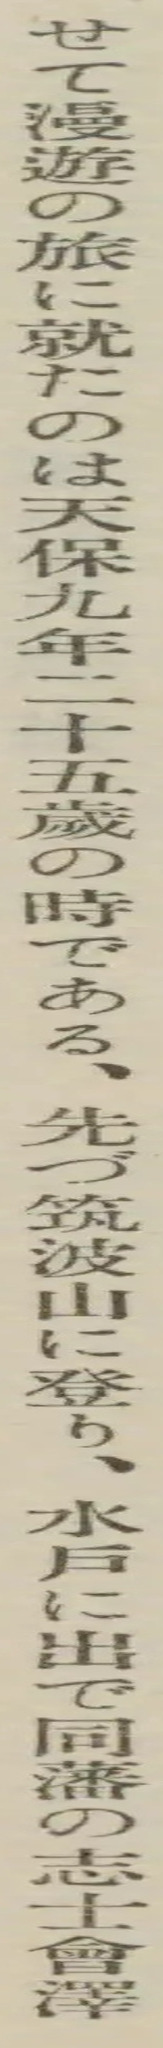せて漫遊の旅に就たのは天保九年二十五歳の時である、先づ筑波山に登り、水戸に出で同藩の志士會澤
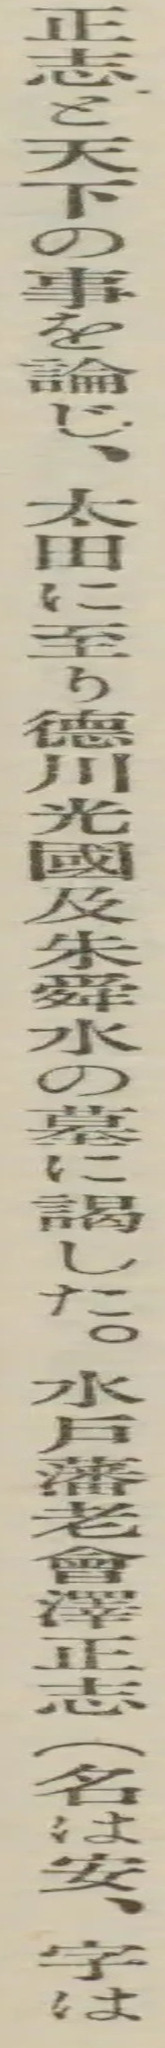正志と天下の事を論じ、太田に至り徳川光國及朱舜水の墓に謁した。水戸藩老會澤正志(名は安、字は
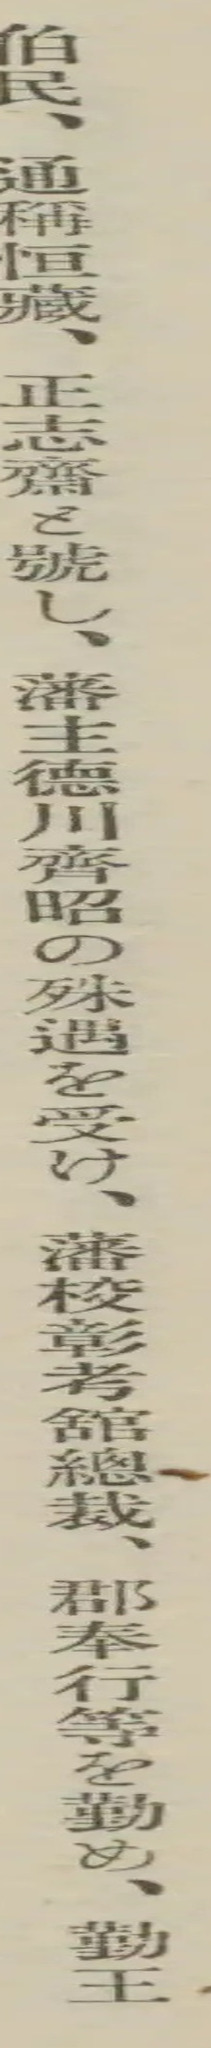伯民、通称恒蔵、正志齋と号し、藩主徳川齊昭の殊遇を受け、藩校彰考舘総裁、郡奉行等を勤め、勤王
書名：小野湖山翁小伝
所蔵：国立国会図書館 National Diet Library, JAPAN
